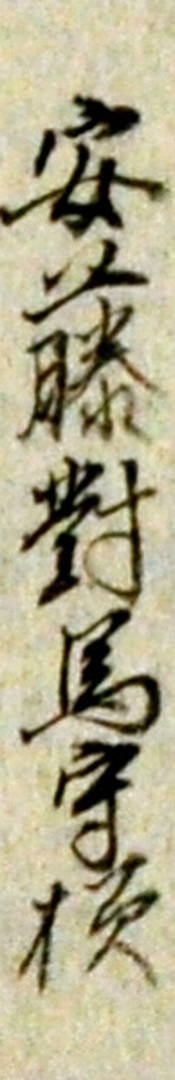安藤對馬守様
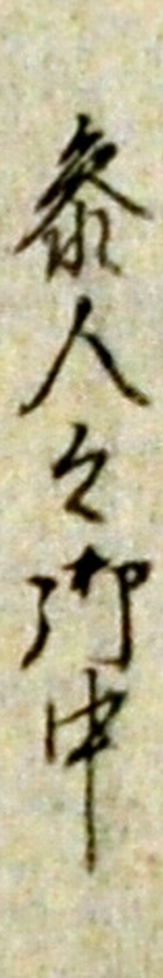参人々御中
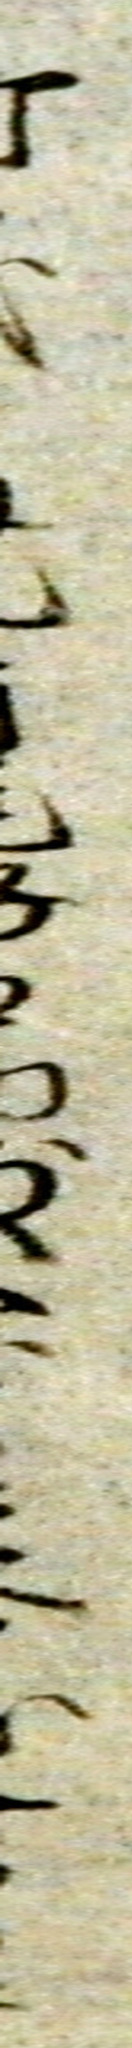席二付御名代者拝礼首尾好相勤致大慶候段申述此間ニ

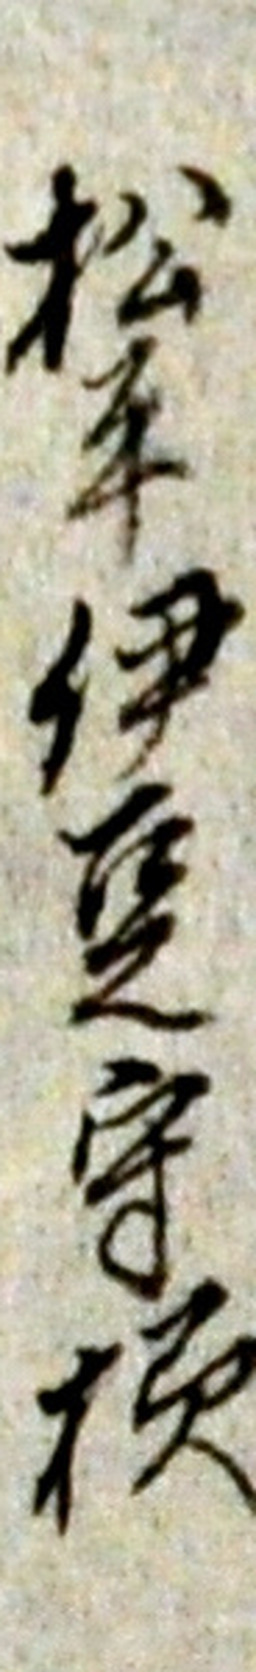松本伊豆守様
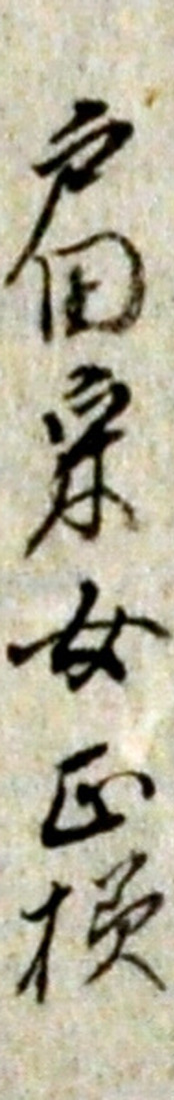戸田采女正様
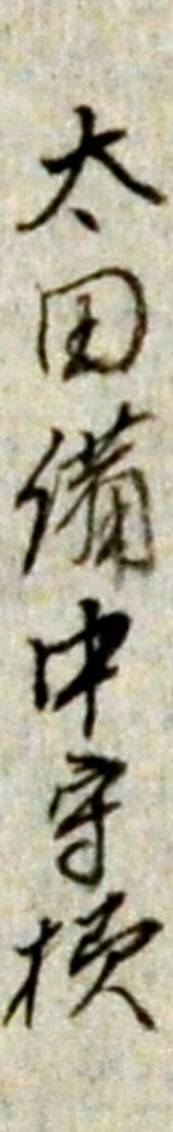太田備中守様
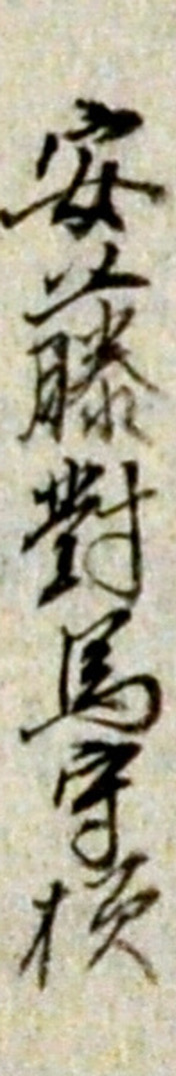安藤対馬守様
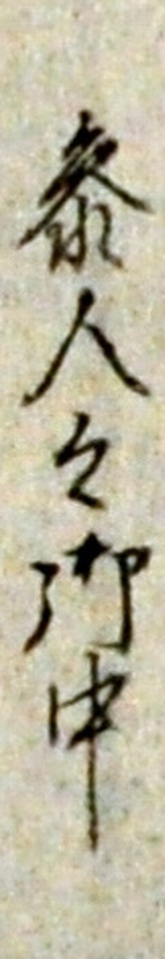参人々御中
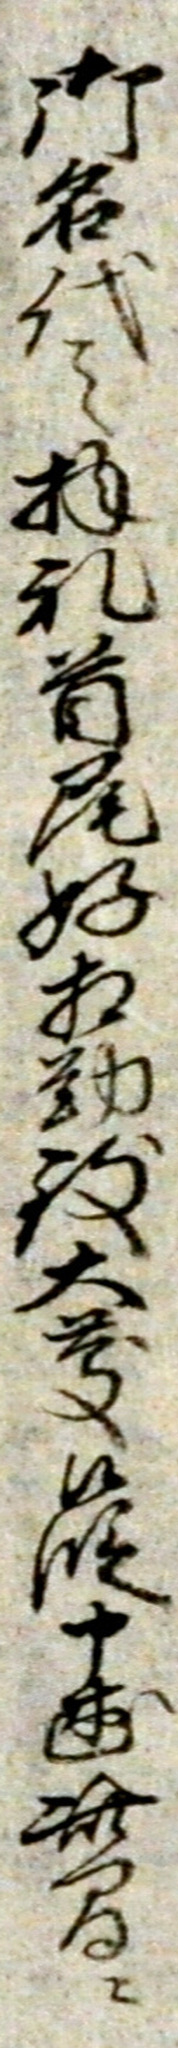御名代之拝礼首尾好相勤致大慶候段申述此間ニ
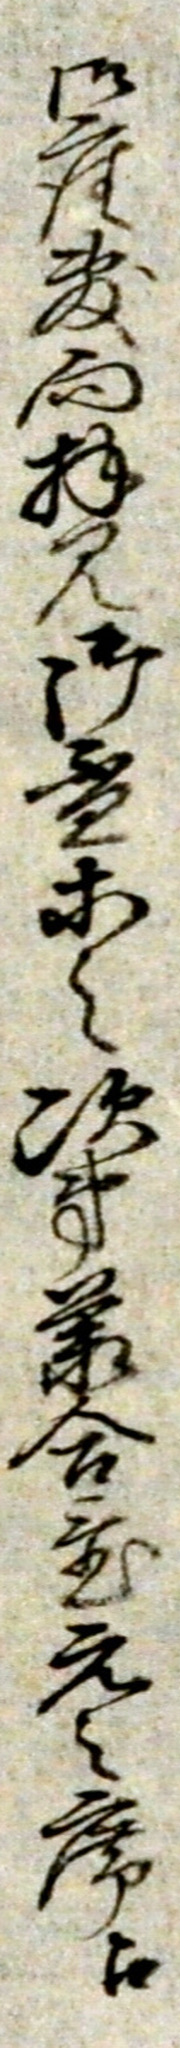御座敷向拝見御盃等之次第承合置元之席江
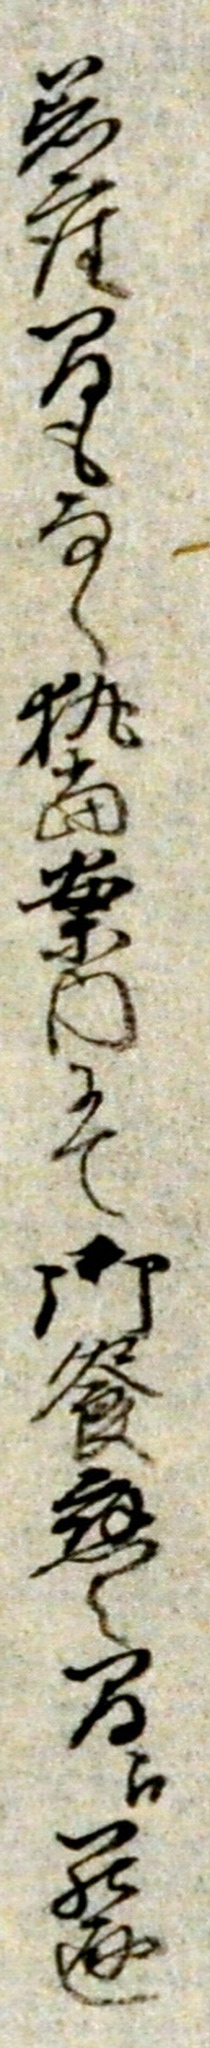着座間もなく執当案内にて御饗応之間江罷通
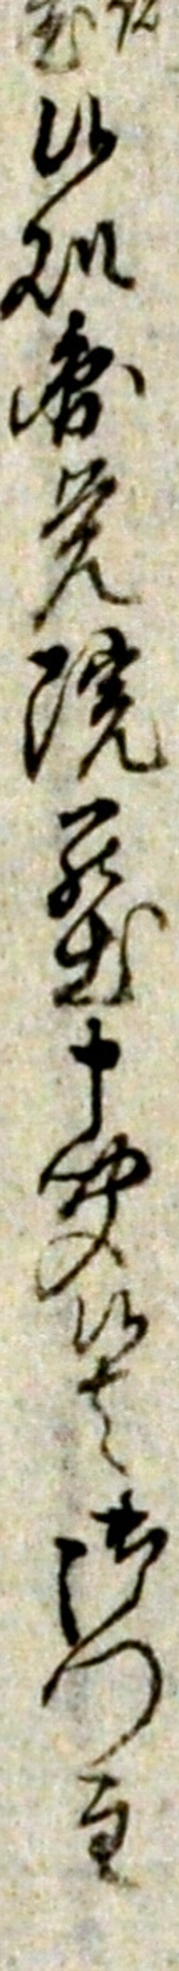候処円覚院罷出申聞候者御門主
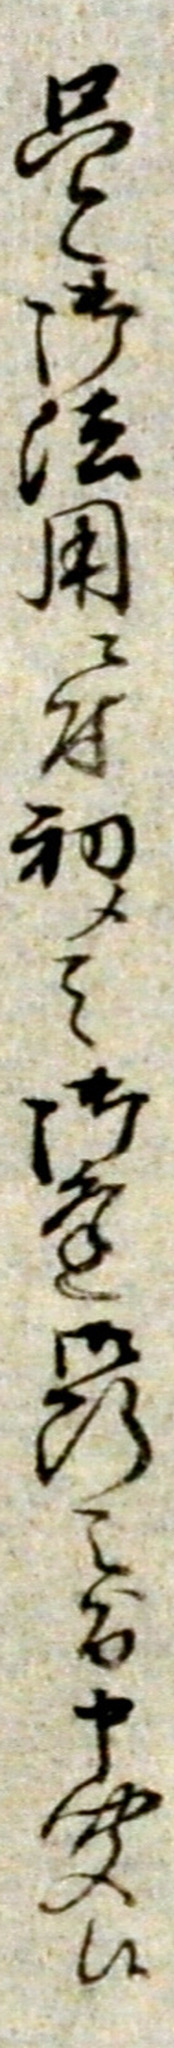只今御法用ニ付初メ者御逢御断之旨申聞候
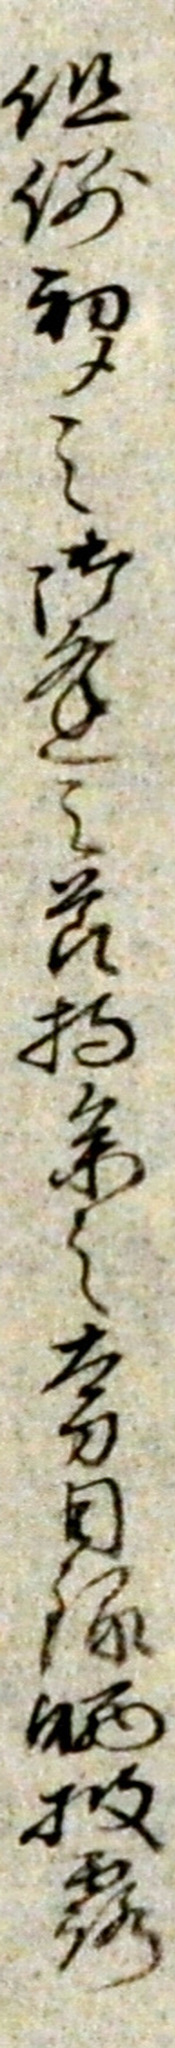但例初メ之御逢之節持参之太刀目録晒披露
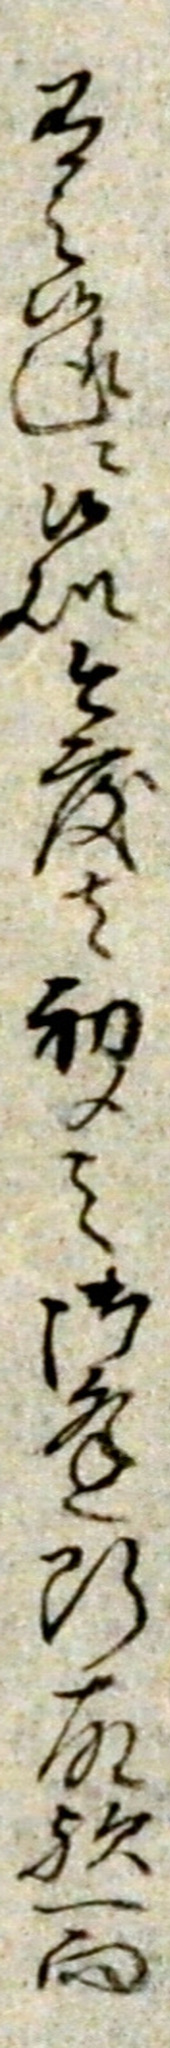有之候趣ニ候処今度者初メ者御逢断故歟一向
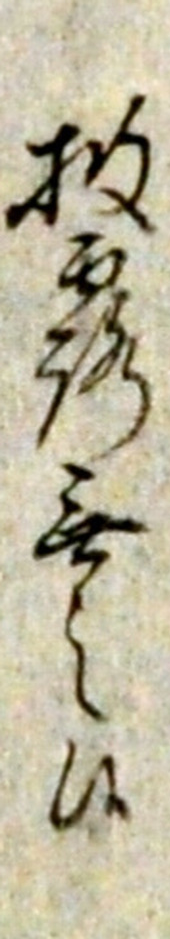披露無之候
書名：日光御名代相勤候節ノ留
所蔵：伊那市立高遠町図書館・合同会社AMANE
